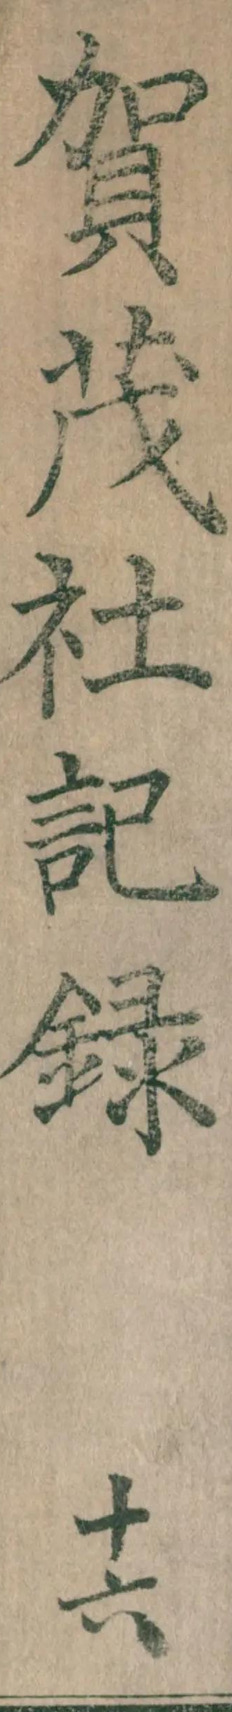賀茂社記録十六

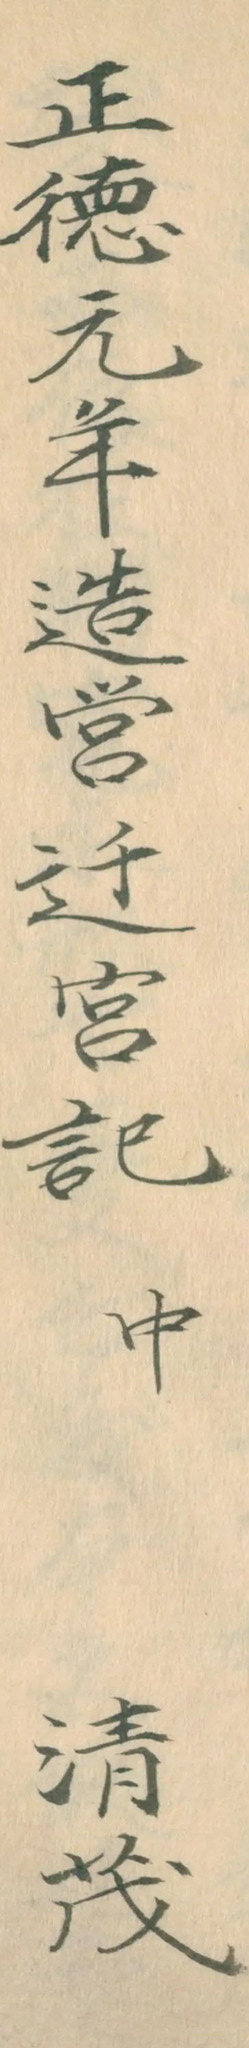正徳元年造営迁宮記中清茂
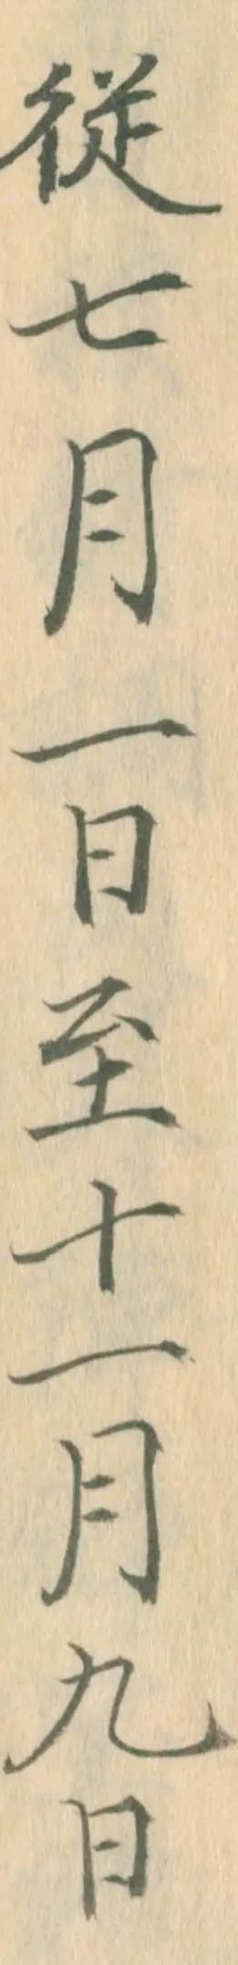従七月一日至十一月九日

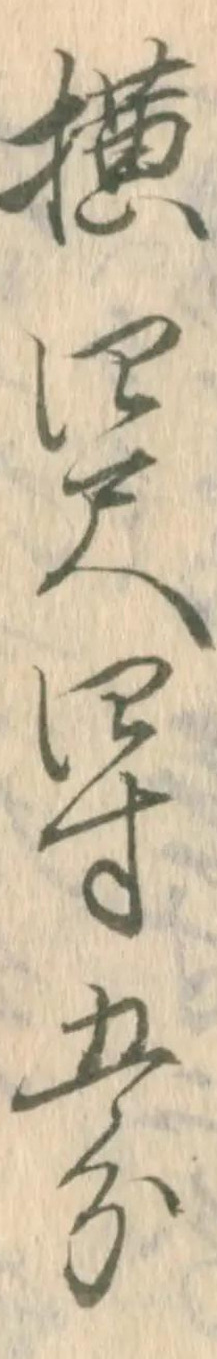横四尺四寸五分
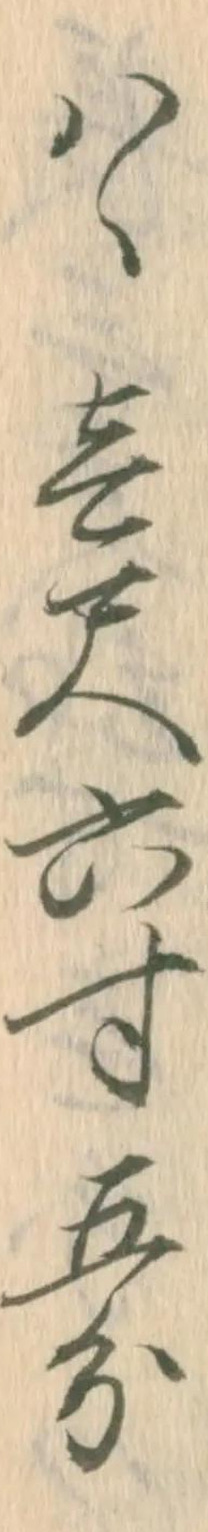ハヽ壱尺六寸五分
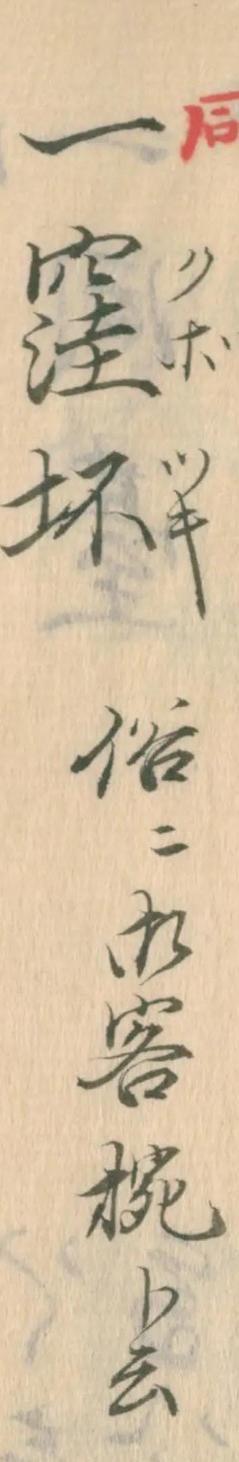一窪坏俗ニ御客椀ト云
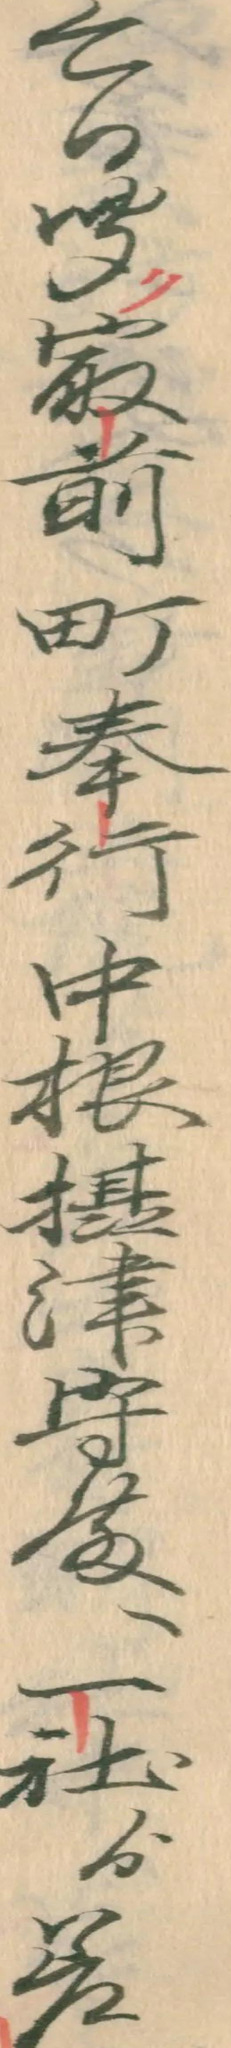今日聞最-前町奉-行中根摂津守殿ヘ一-社ゟ差_
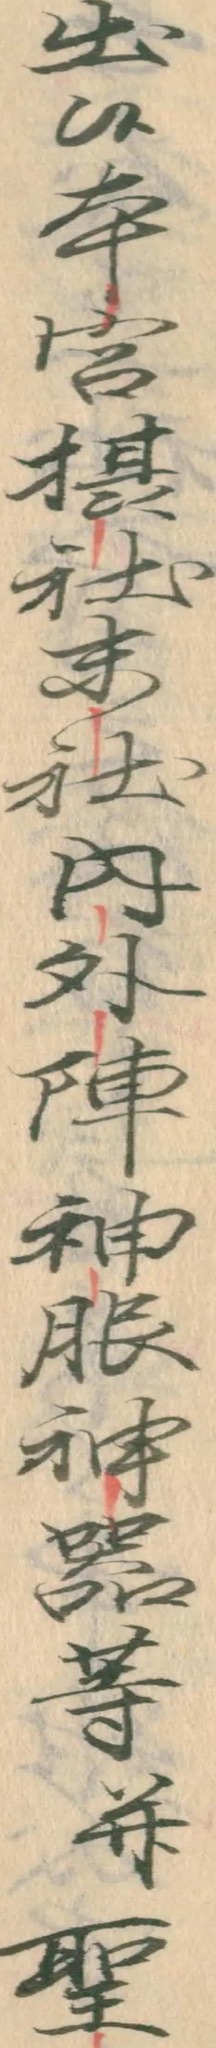出候本-宮摂-社末-社内-外-陣神-服神-器等并聖-
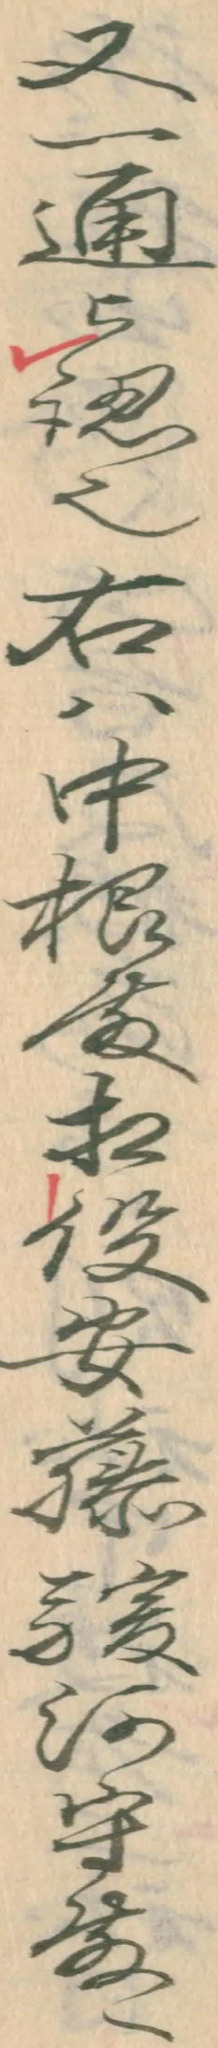又一通被認也右ハ中根殿相_役安藤駿河守殿ヘ
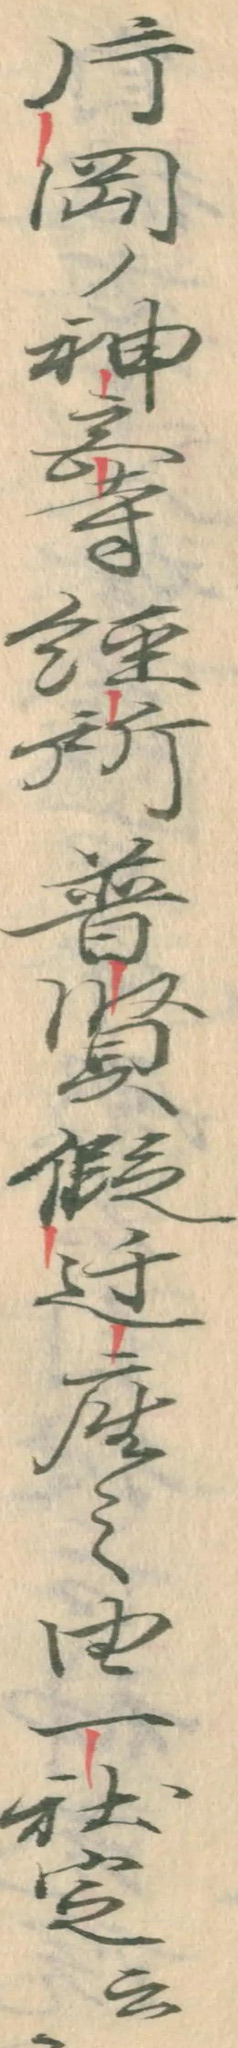片_岡ノ神-宮-寺経-所普-賢仮_迁-座之由一-社定云々

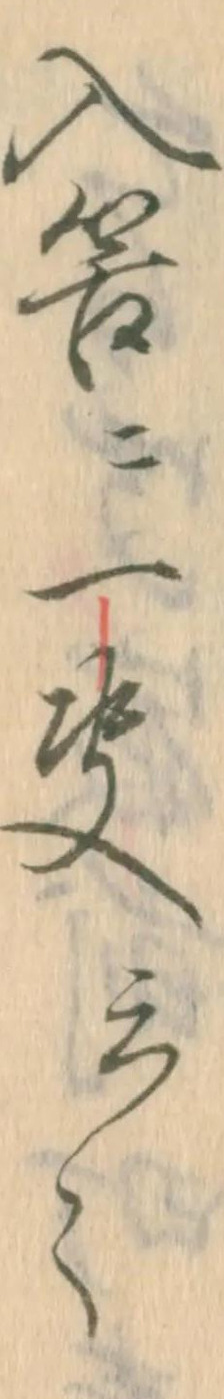入筈ニ一-決云々
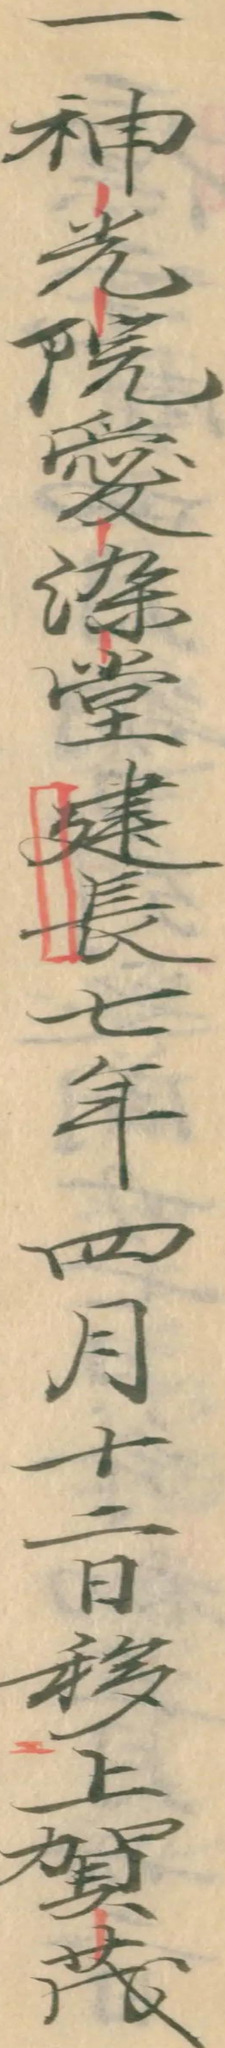一神-光-院愛-染-堂建長七年四月十二日移上賀-茂
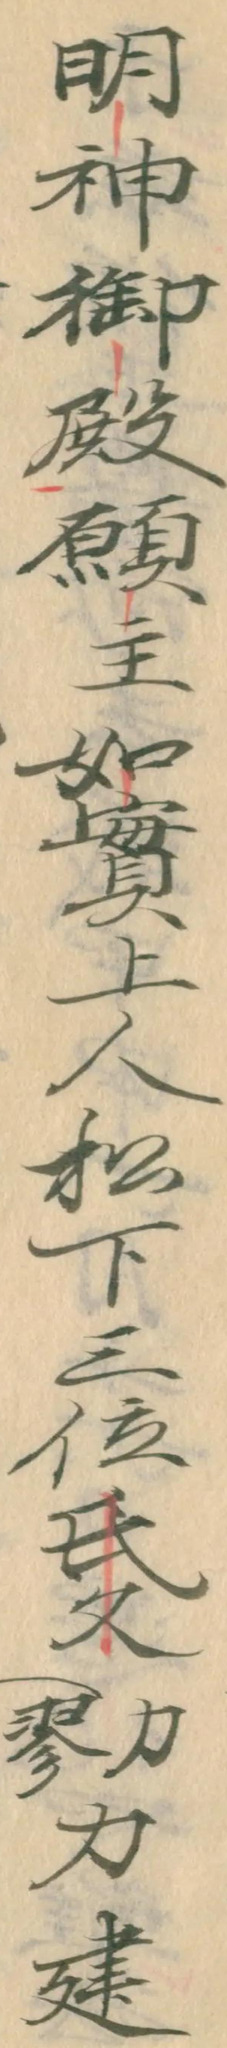明-神御-殿願-主如-実上人松下三位氏久勠力建
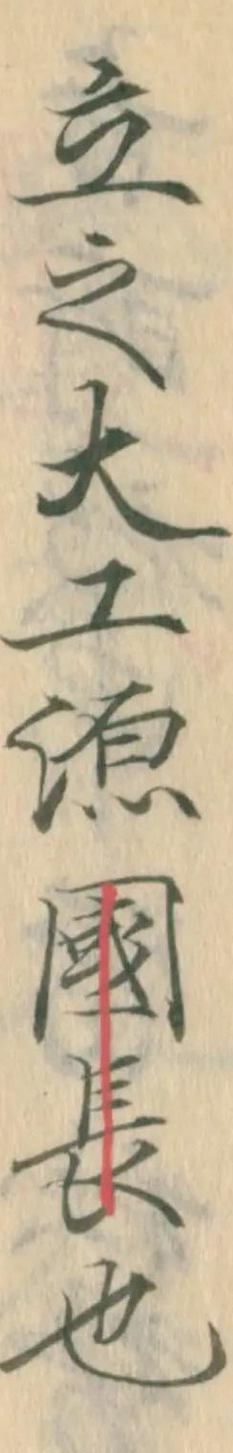立之大工源国長也
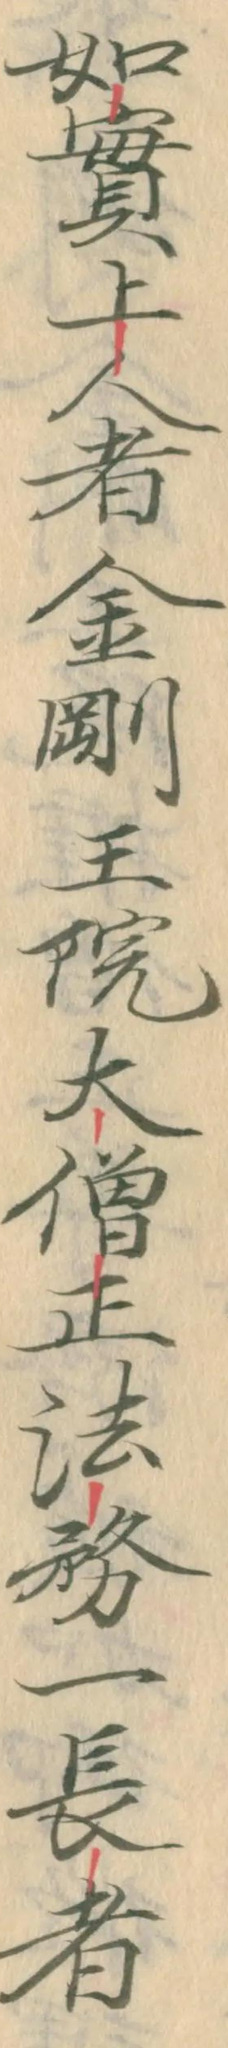如-実上-人者金剛王院大-僧-正法-務一長-者

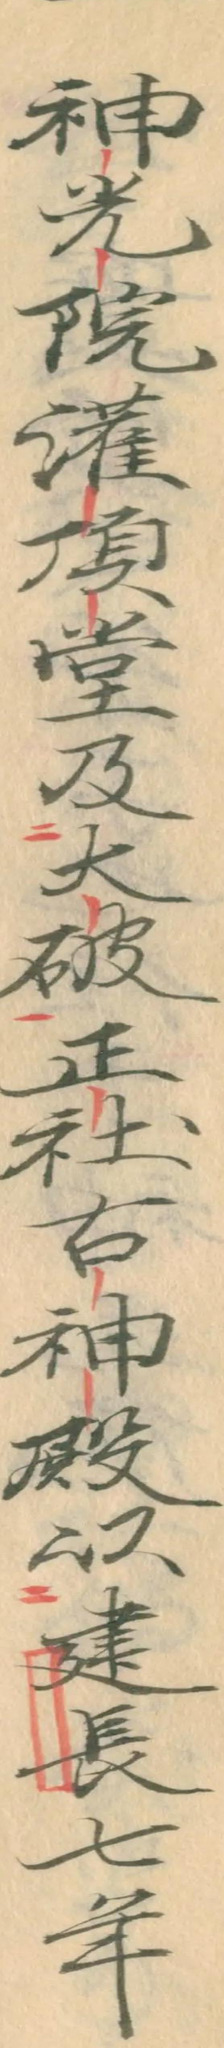一神-光-院灌-頂-堂及大-破正-社古-神-殿以建長七年
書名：賀茂社記録. 第16冊
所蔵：国立国会図書館 National Diet Library, JAPAN
